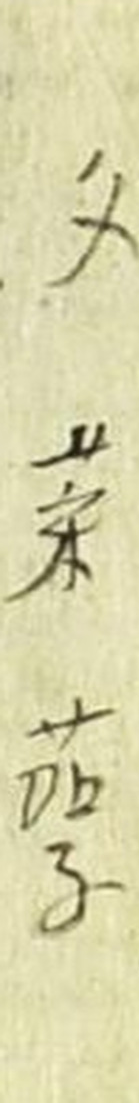夕菜茄子
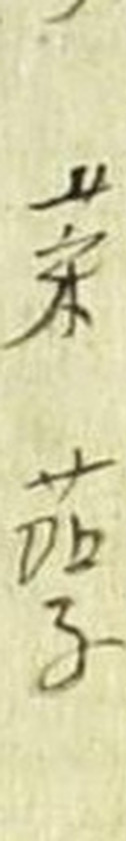夕菜茄子
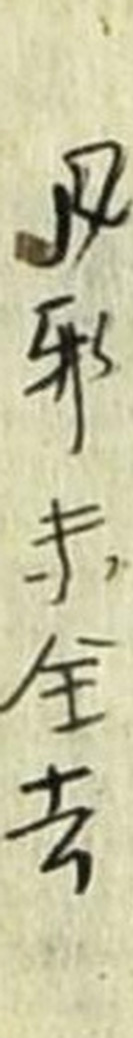風邪未全去
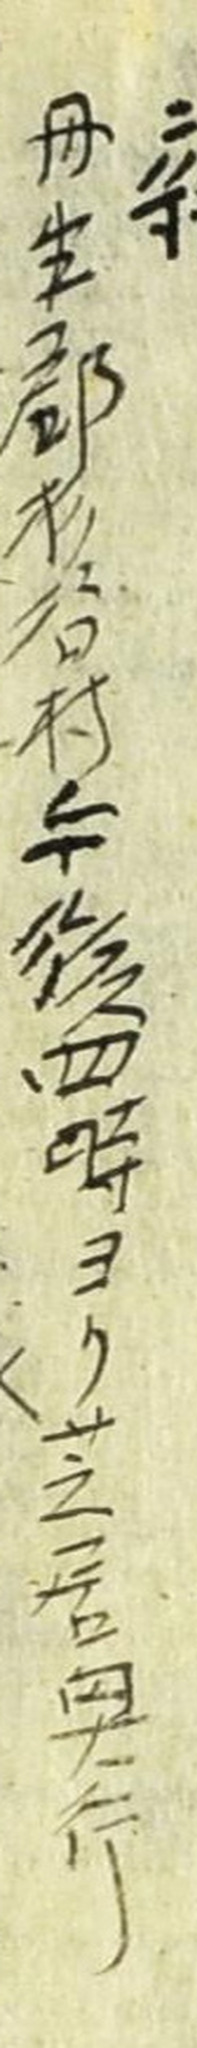丹生郡杉谷村午後四時ヨリ芝居興行

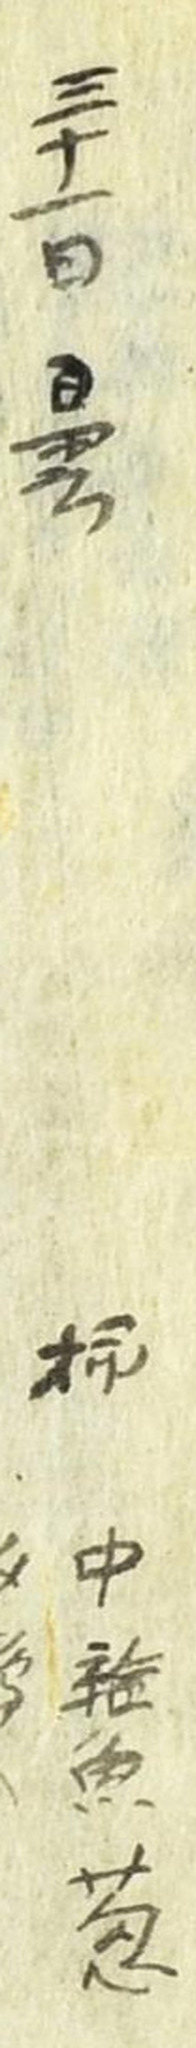三十一日曇柿中雑魚葱
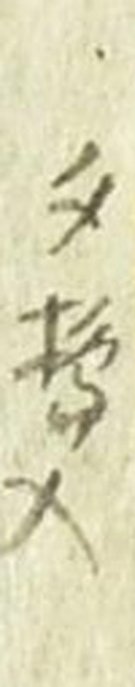夕搗入
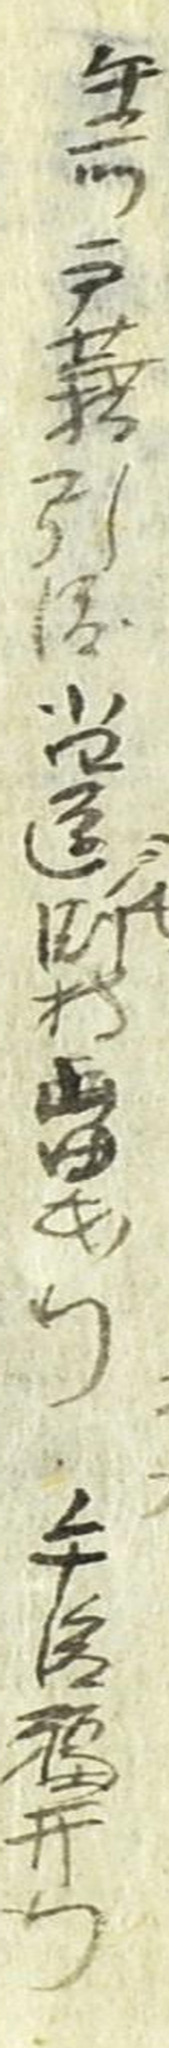午前戸籍引渡小四区戸長淵村山田氏行午後福井行
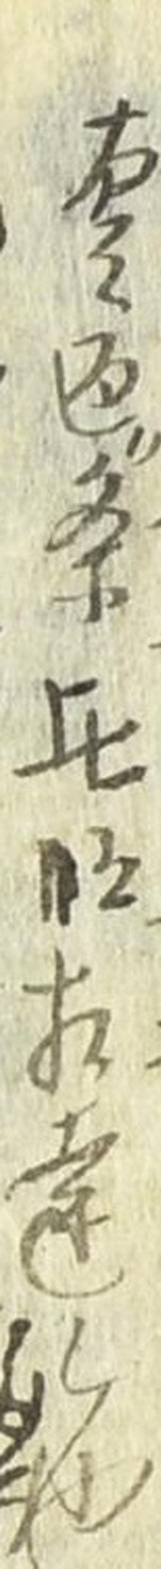右之通リ条此段相達候也
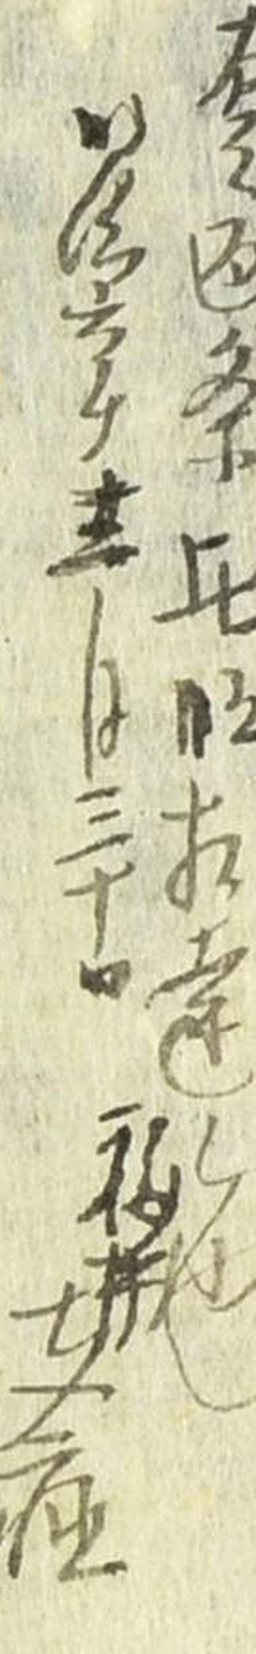明治六年十二月三十日福井支庁

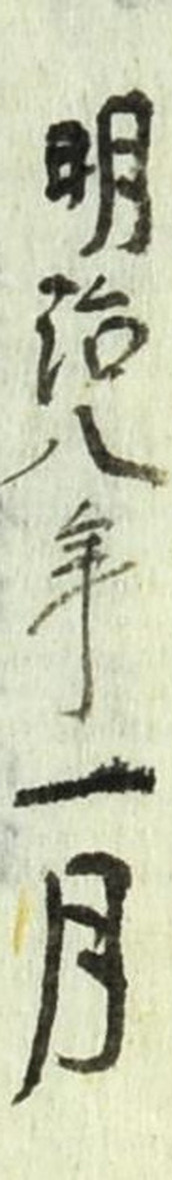明治八年一月
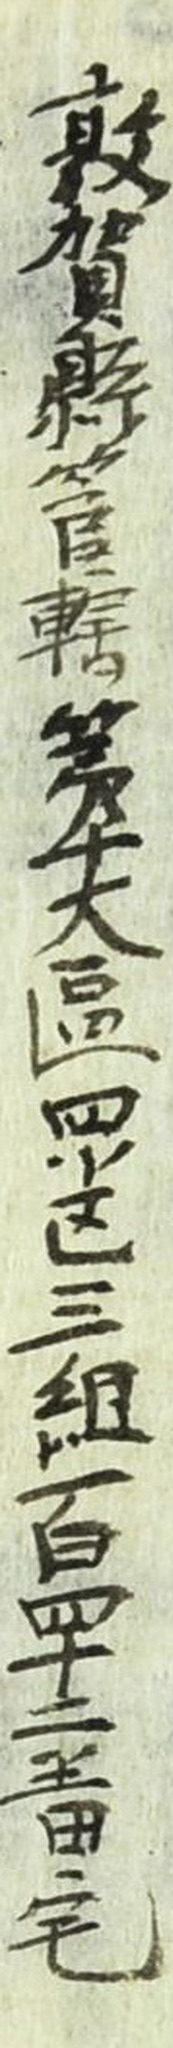敦賀県管轄第十大区四小区三組百十二番宅
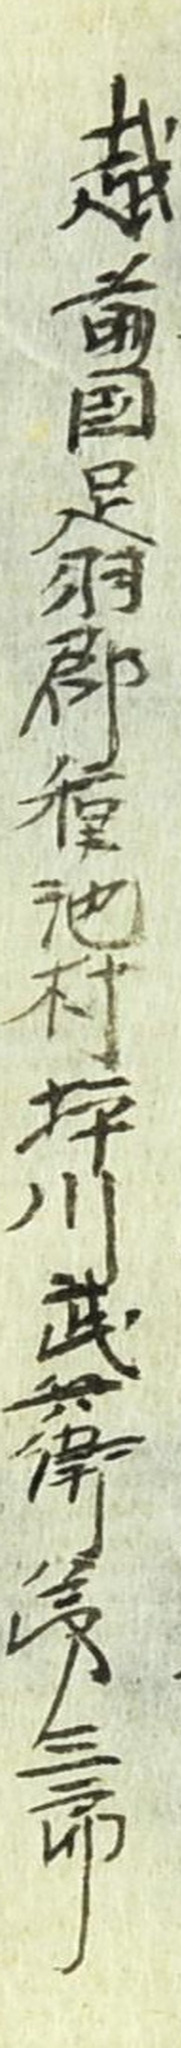越前国足羽郡種池村坪川武兵衛弟三郎
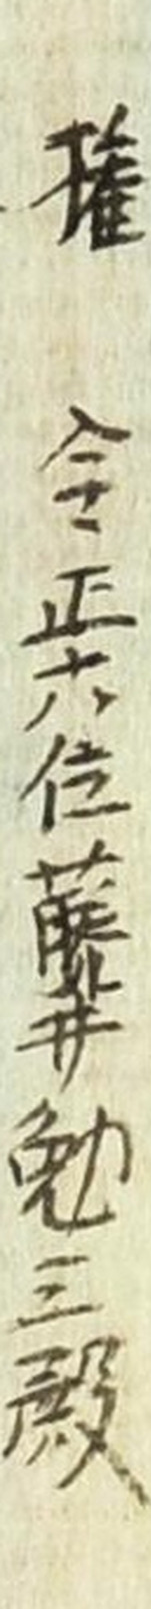権令正六位藤井勉三殿
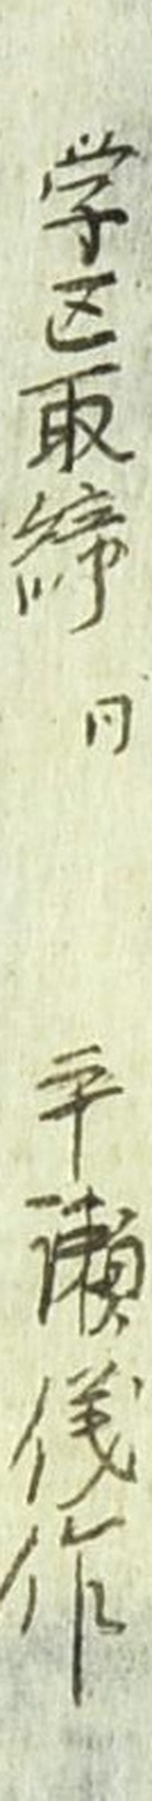学区取締同平瀬儀作
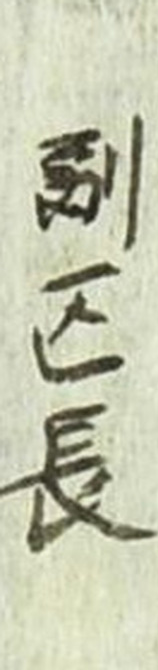副区長
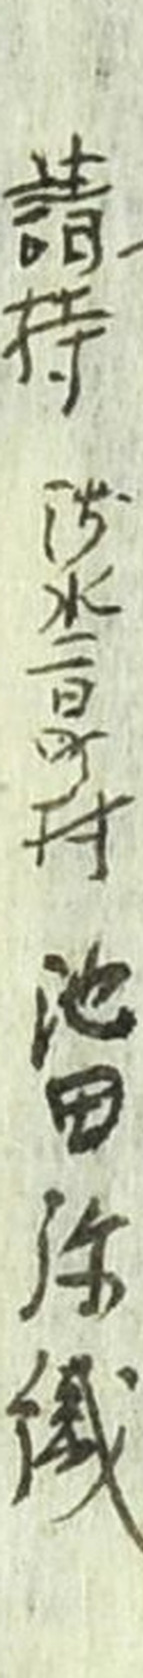請持浅水二日町村池田弥織
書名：（日記）
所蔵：福井県文書館 Fukui Prefectural Archives
